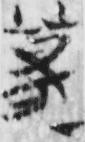○（春）
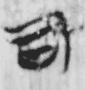司
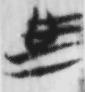馬
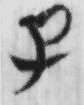子
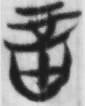音
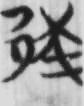○（蔡）
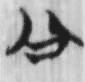公
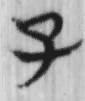子
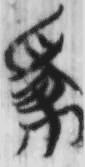○（家）
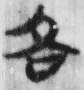各
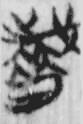戠
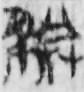豢
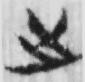之
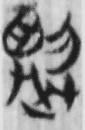○（舉）
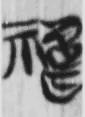禱
